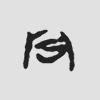君
